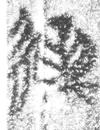緄
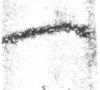一
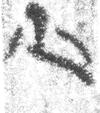少（小）
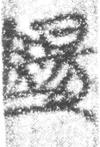○（陽）
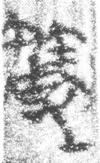笲
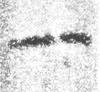一
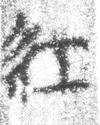紅
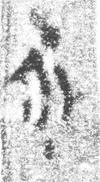介
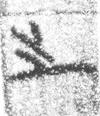之
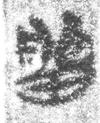留
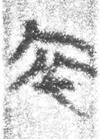衣
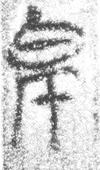帛
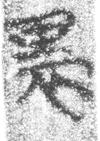裏
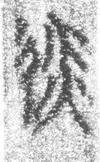緂
